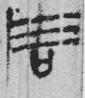石
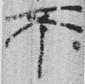不
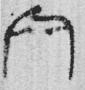夂（終）
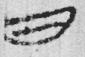日
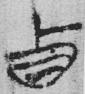貞
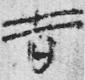吉
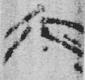六
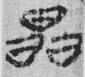晶（三）
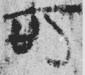可（阿）
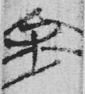○（豫）
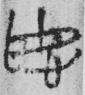○（悔）
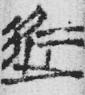{辶𡰥}（遲）
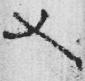又
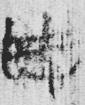悔
